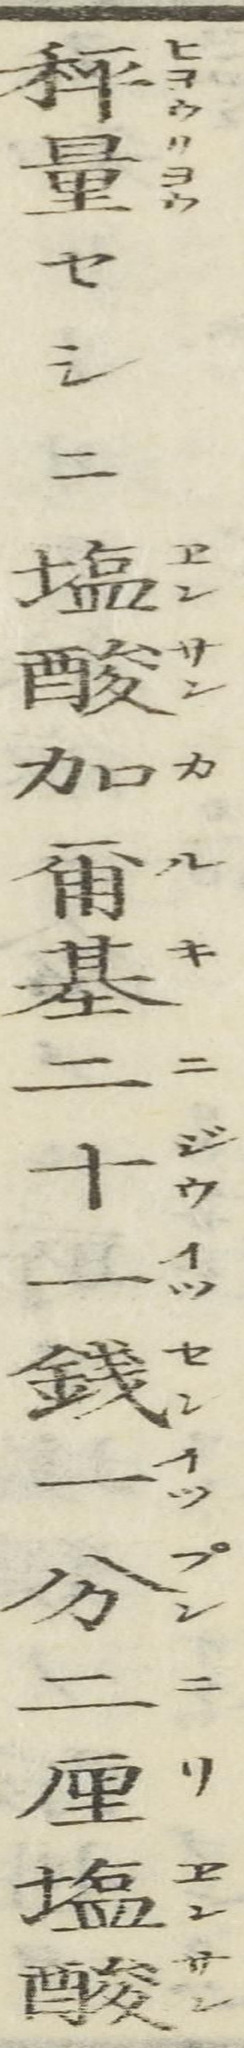秤量セシニ塩酸加爾基二十一銭一分二厘塩酸
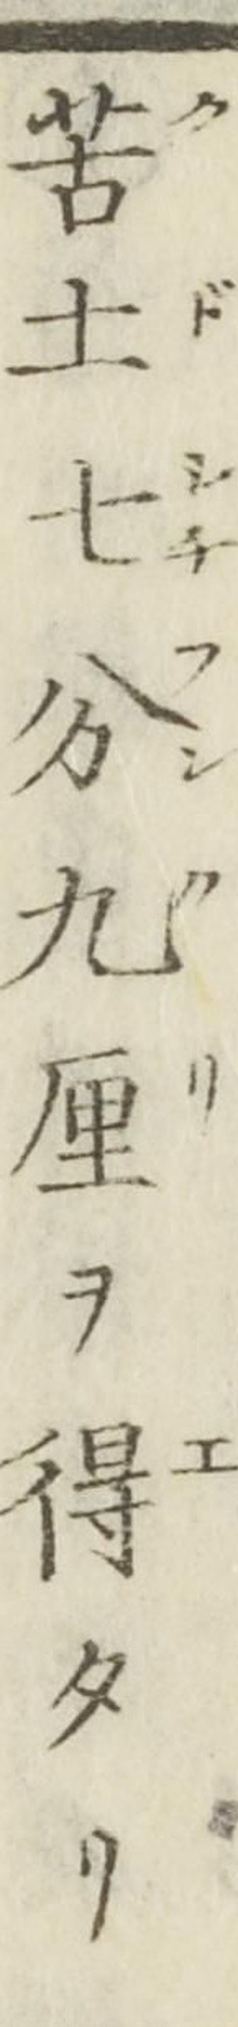苦土七分九厘ヲ得タリ
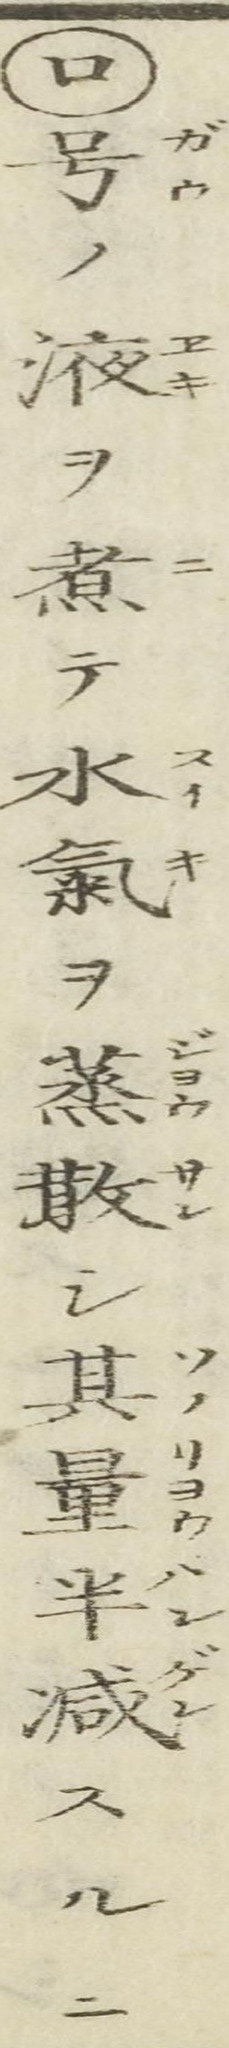㋺号ノ液ヲ煮テ水気ヲ蒸散シ其量半減スルニ
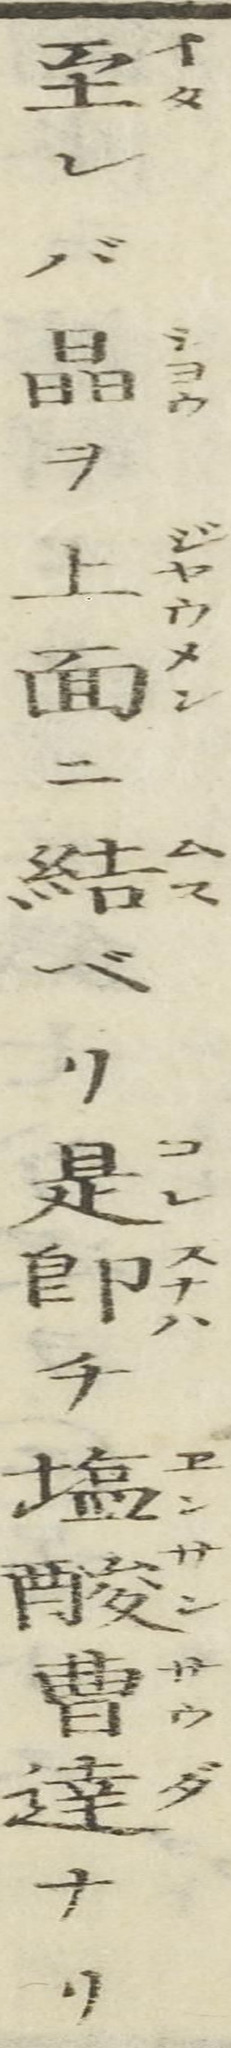至レバ晶ヲ上面ニ結ベリ是即チ塩酸曹達ナリ
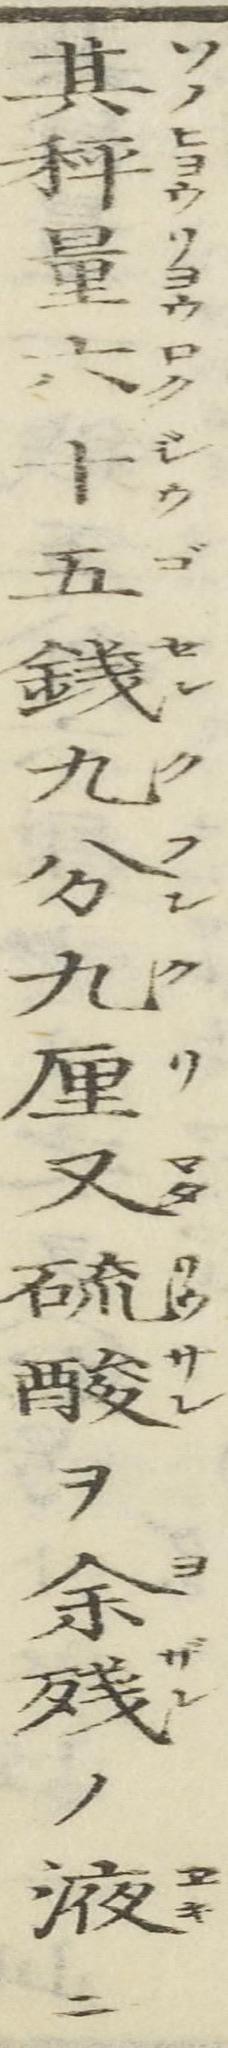其秤量六十五銭九分九厘又硫酸ヲ余残ノ液ニ
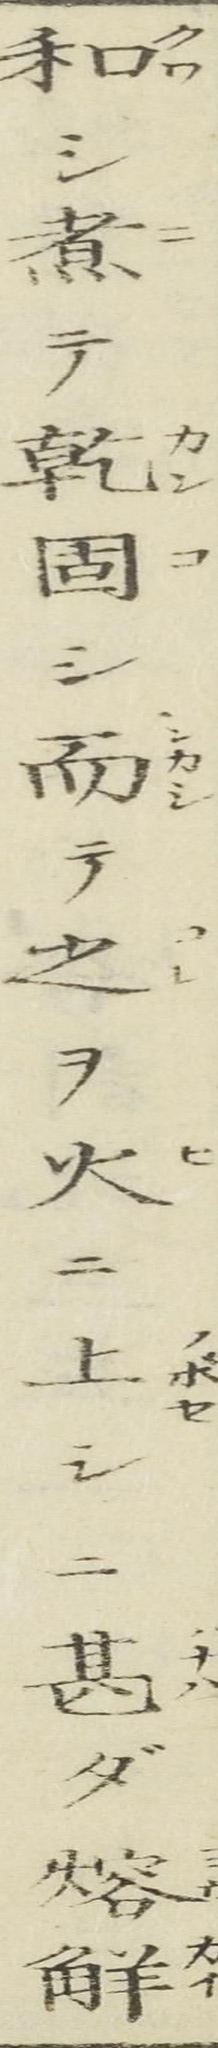和シ煮テ乾固シ而テ之ヲ火ニ上シニ甚ダ熔解
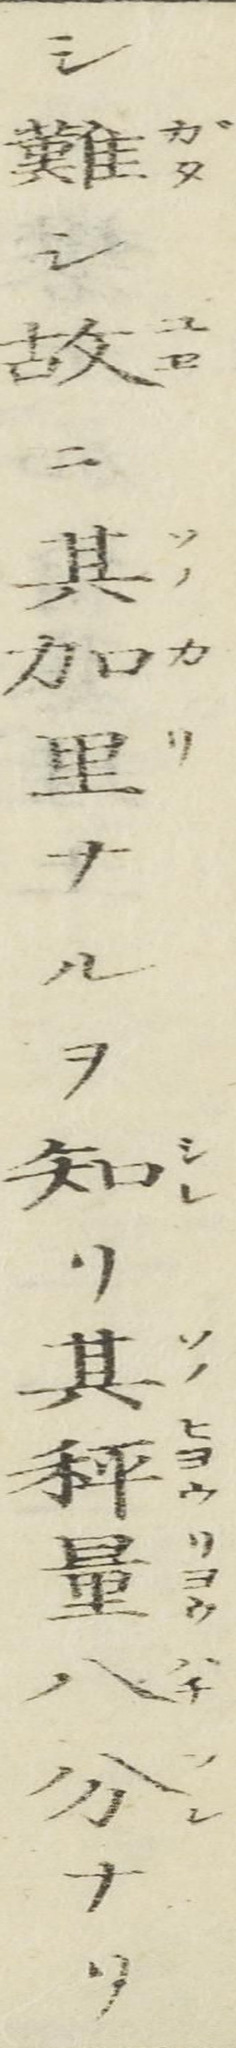シ難シ故ニ其加里ナルヲ知リ其秤量八分ナリ
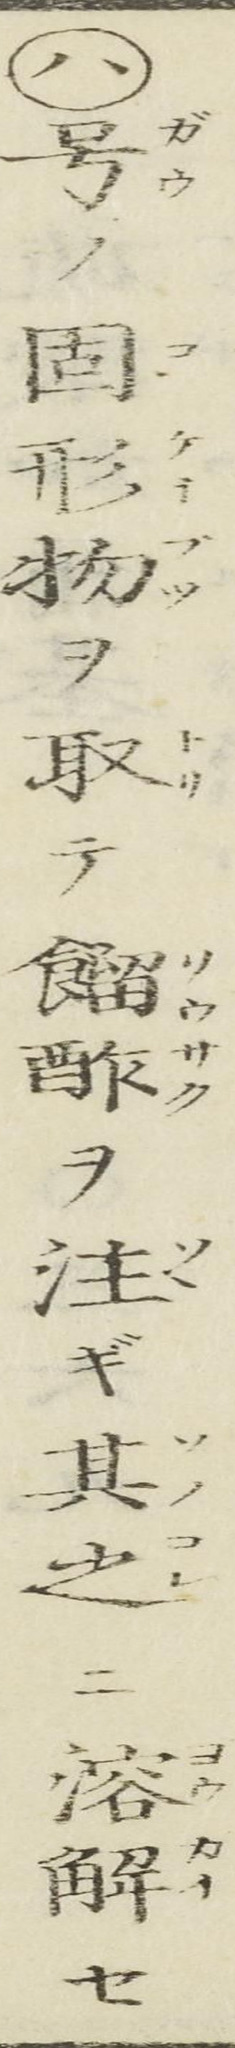㋩号ノ固形物ヲ取テ鎦酢ヲ注ギ其之ニ溶解セ
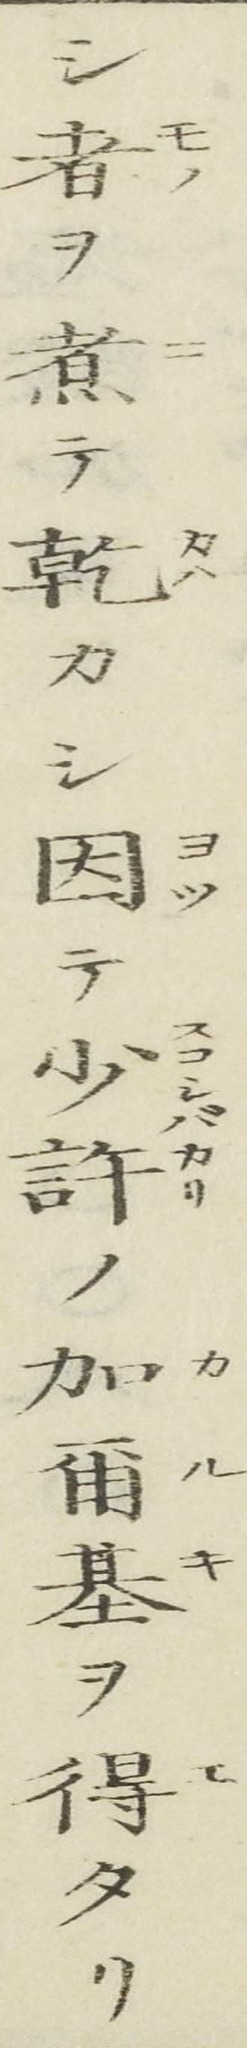シ者ヲ煮テ乾カシ因テ少許ノ加爾基ヲ得タリ
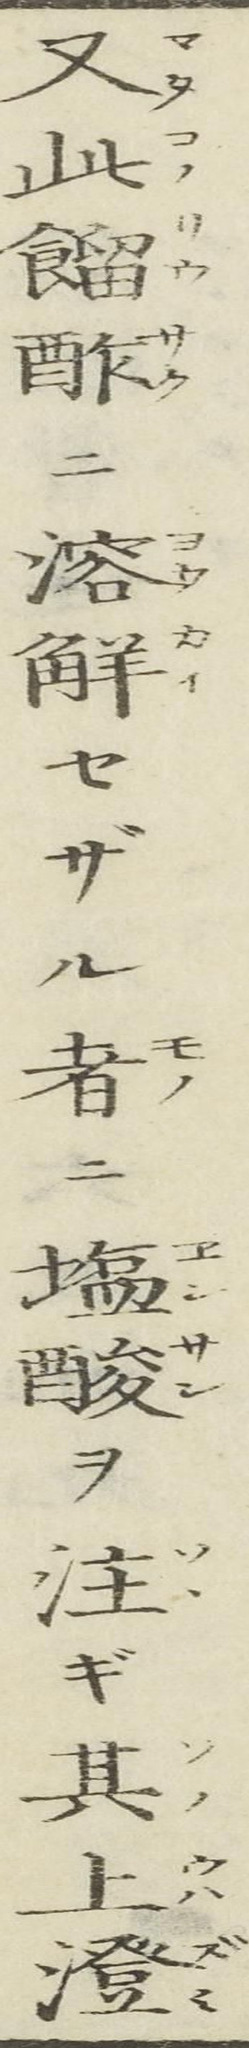又此鎦酢ニ溶解セザル者ニ塩酸ヲ注ギ其上澄
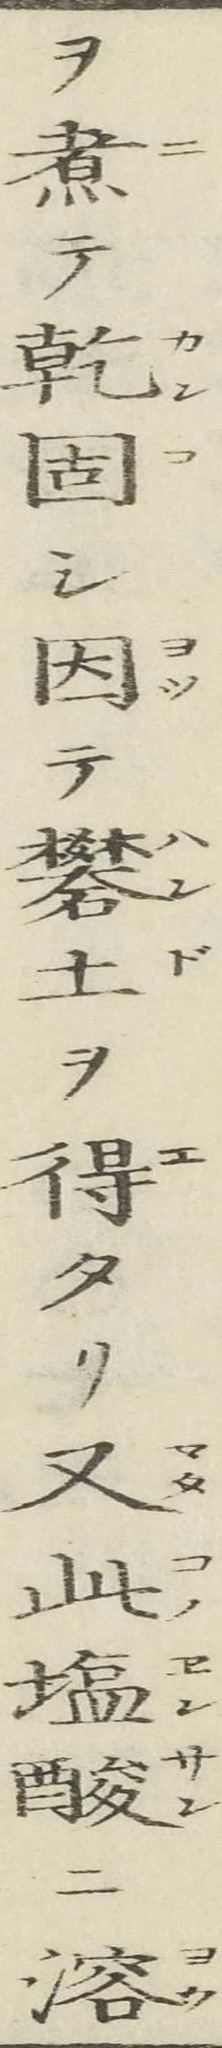ヲ煮テ乾固シ因テ礬土ヲ得タリ又此塩酸ニ溶
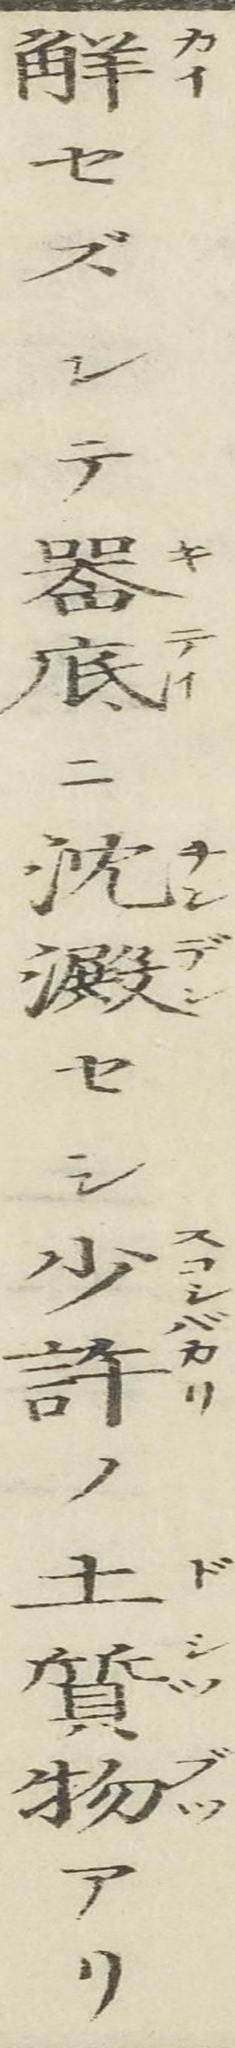解セズシテ器底ニ沈殿セシ少許ノ土質物アリ
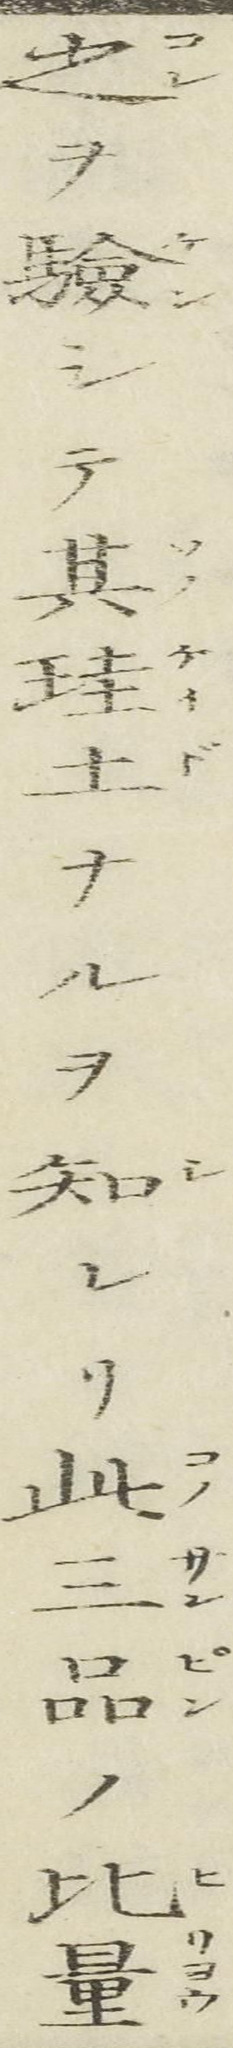之ヲ験シテ其珪土ナルヲ知レリ此三品ノ比量
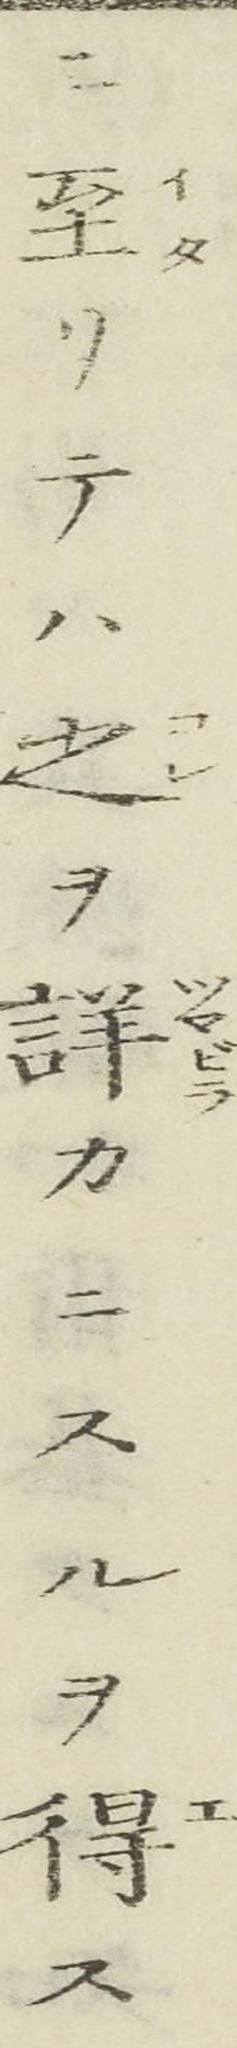ニ至リテハ之ヲ詳カニスルヲ得ス
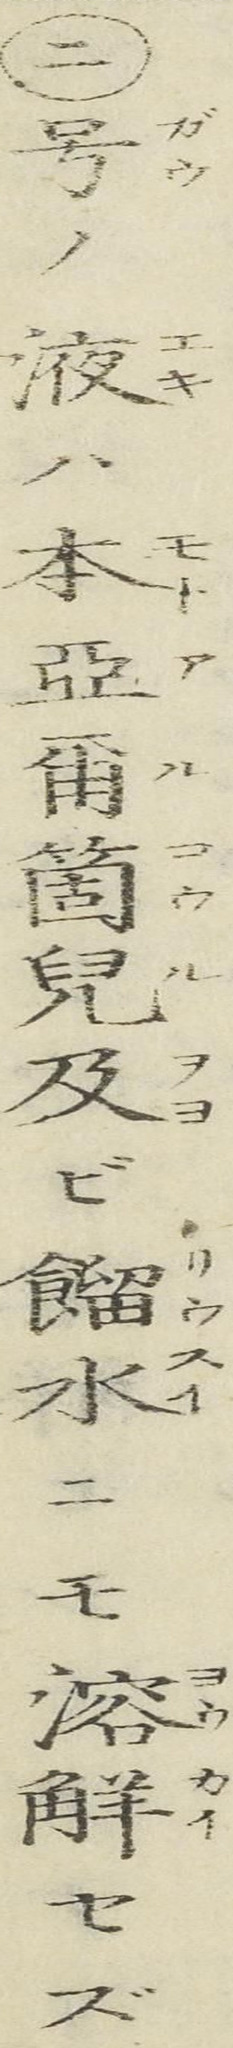㊁号ノ液ハ本亜爾箇兒及ビ鎦水ニモ溶解セズ

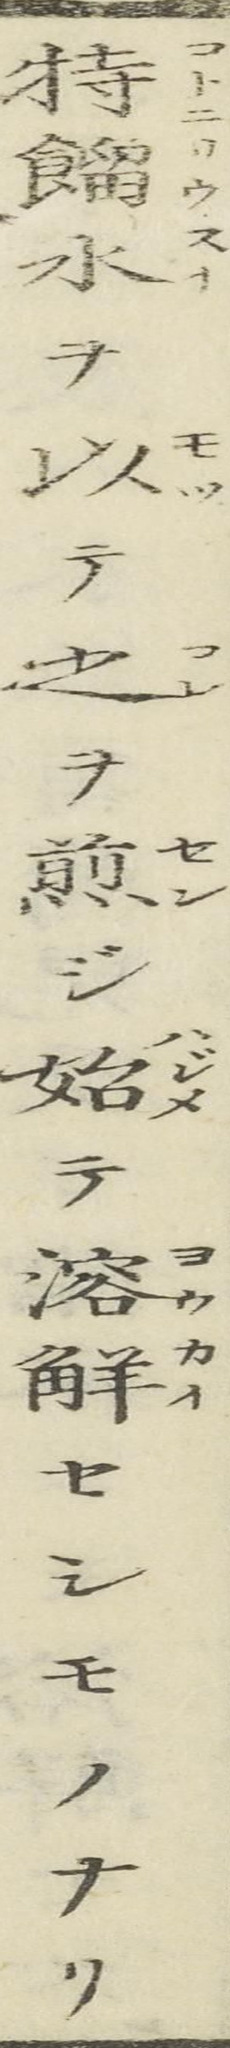特鎦水ヲ以テ之ヲ煎ジ始テ溶解セシモノナリ
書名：熱海温泉考　全
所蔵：東京大学地震研究所図書室 Earthquake Research Institute Library, The University of Tokyo, JAPAN
